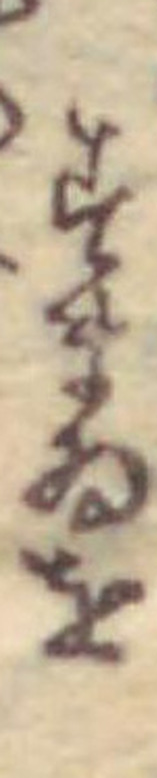すまゐを
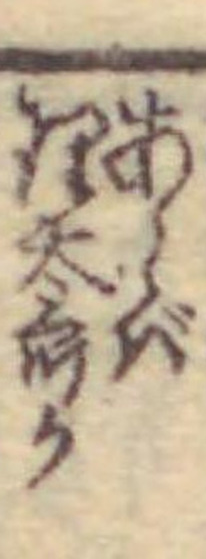理太郎か
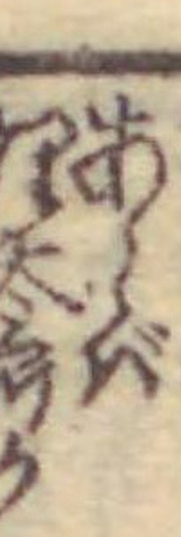あらば
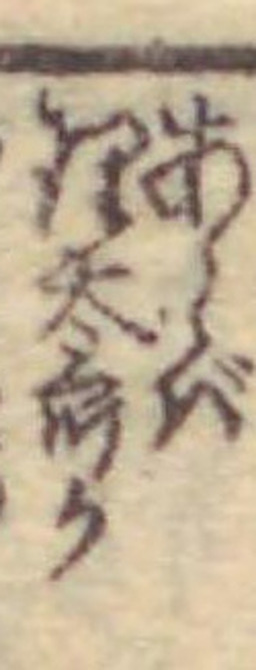理太郎か
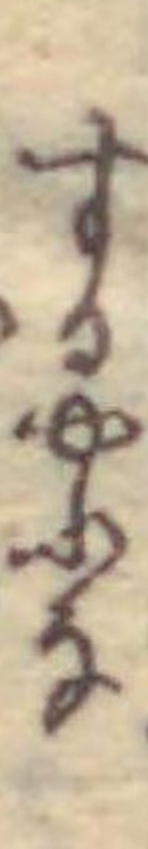するかふな
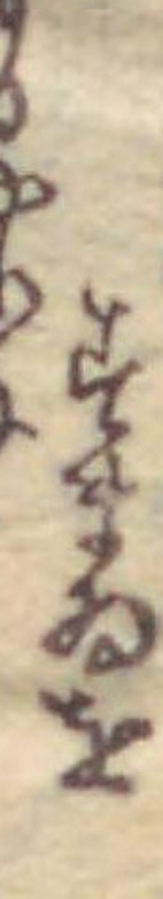すまゐを
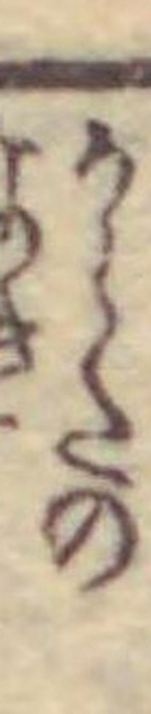からたの
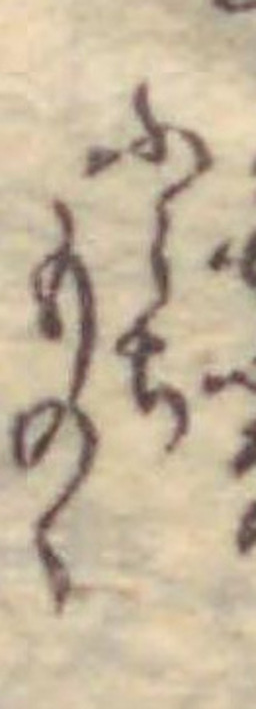ものゝ
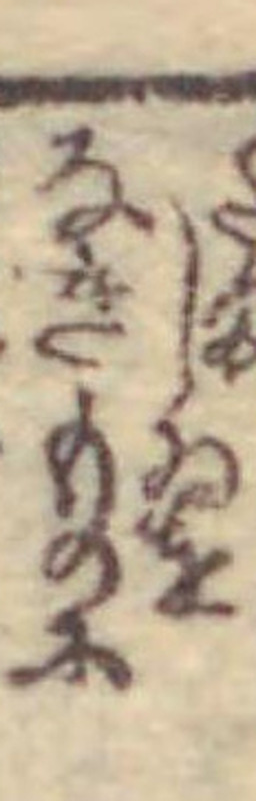なきものに
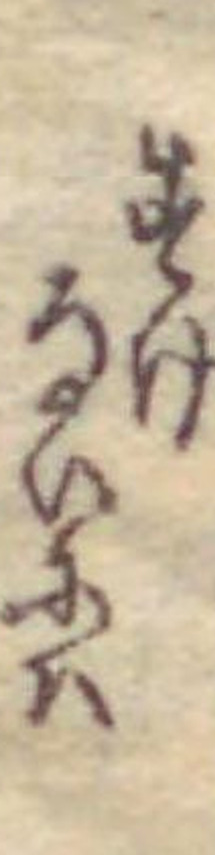ないには
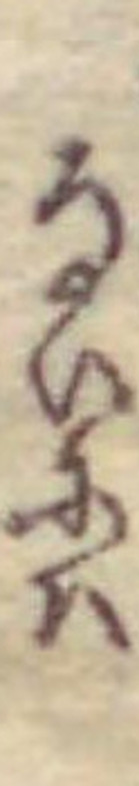ないには
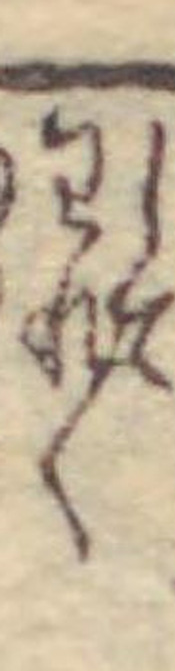われ〳〵
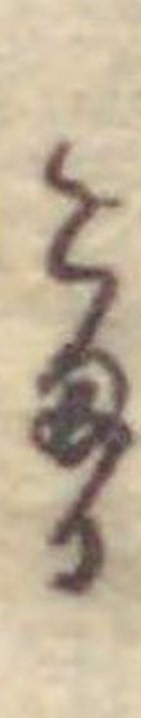こまる
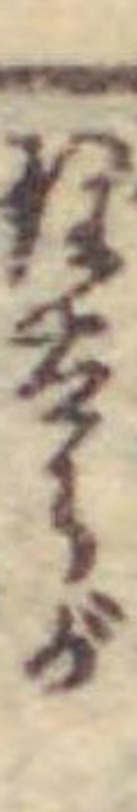理太郎が
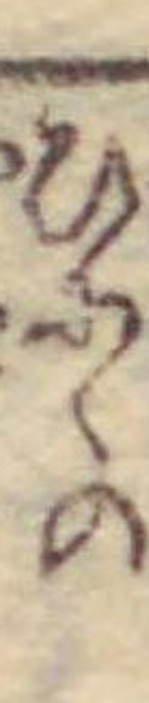ひにくの
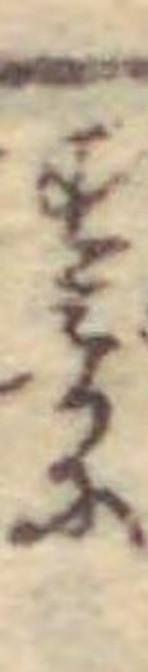すみかに
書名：心学早染艸 : 3巻
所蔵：国立国会図書館 National Diet Library, JAPAN
